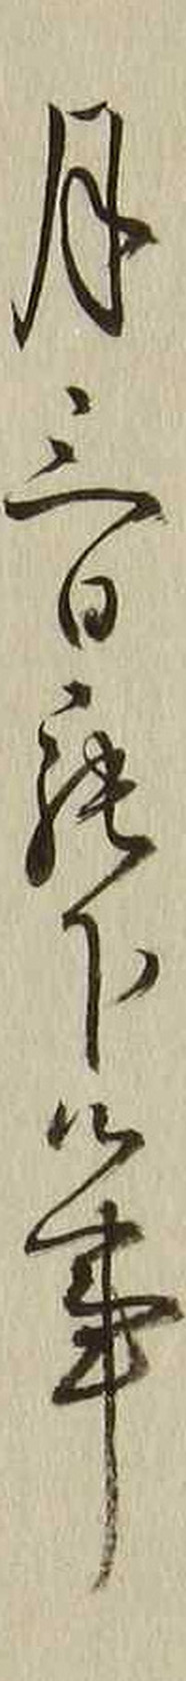月三日罷下候事
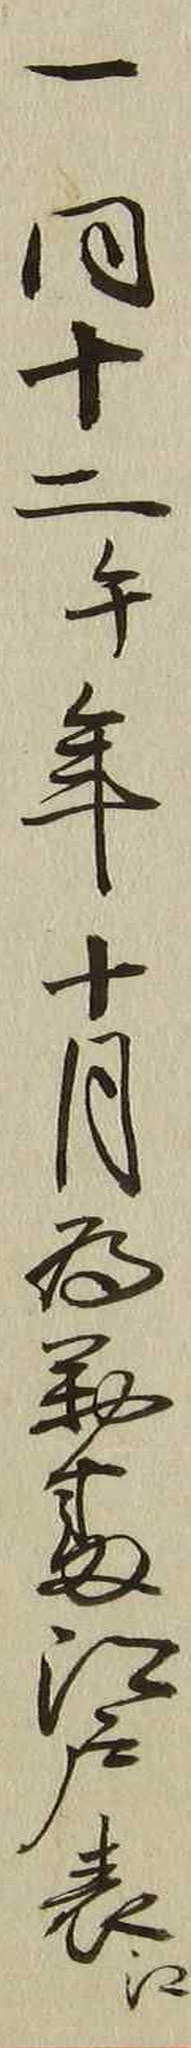一同十二午年十月為勤番江戸表江
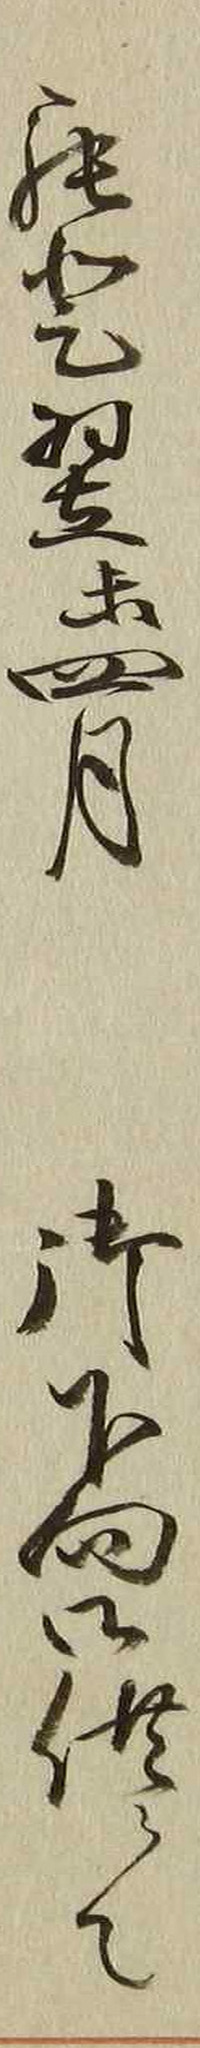罷登翌未四月御下向御供ニて
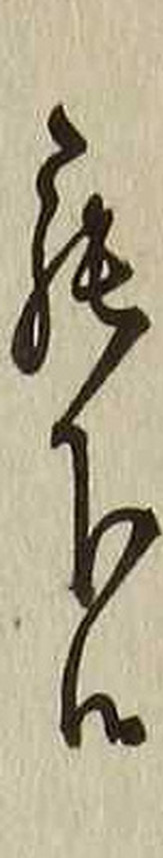罷下候
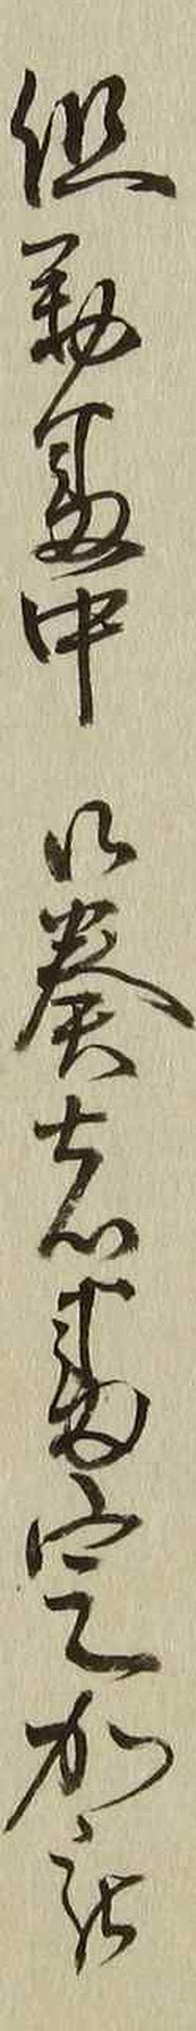但勤番中御奏者番定加被
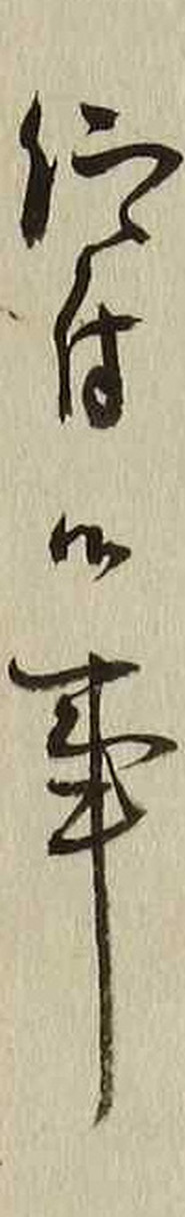仰付候事
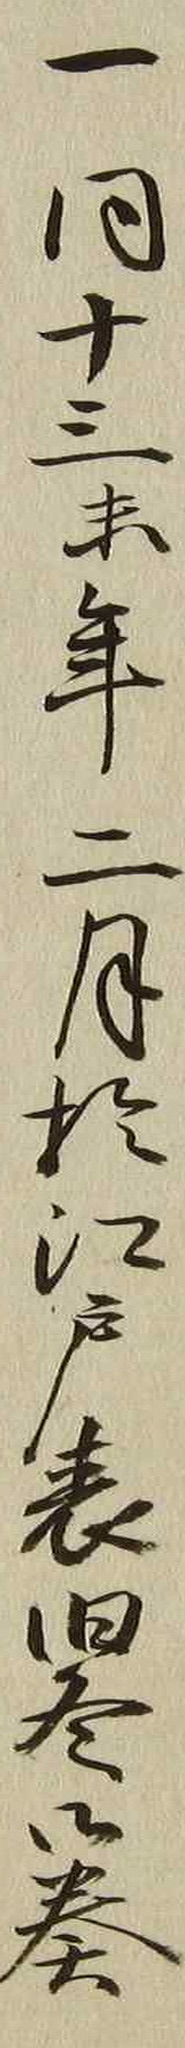一同十三未年二月於江戸表旧冬御奏
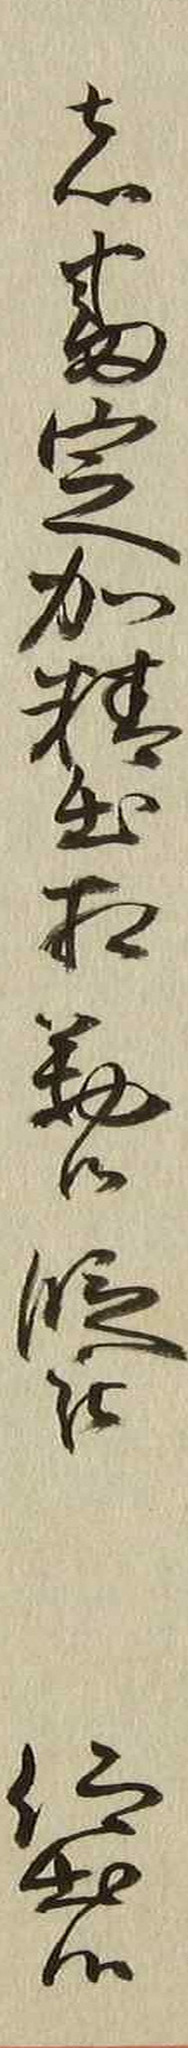者番定加精出相勤候段被仰出候
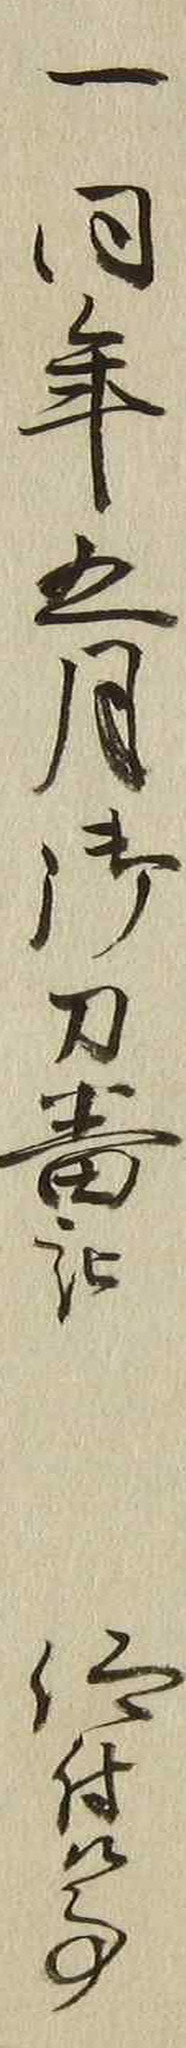一同年五月御刀番被仰付候事
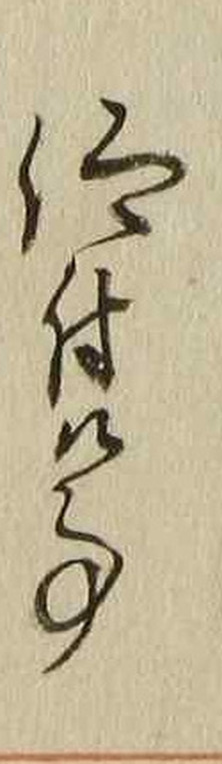仰付候事
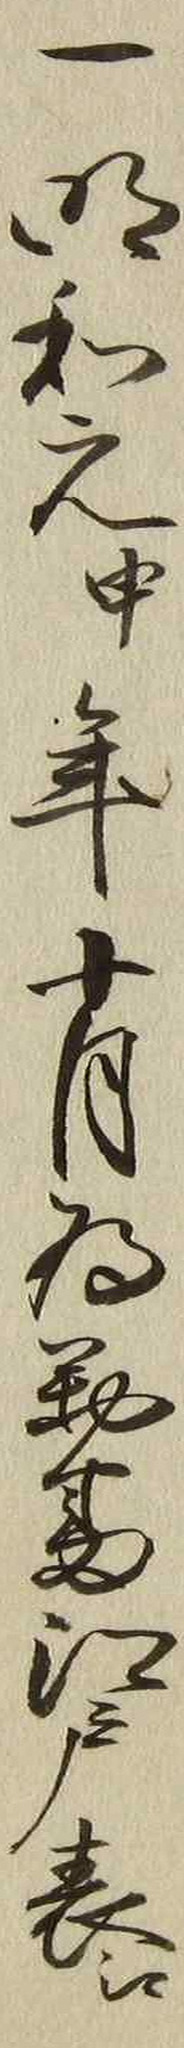一明和元申年十月為勤番江戸表江
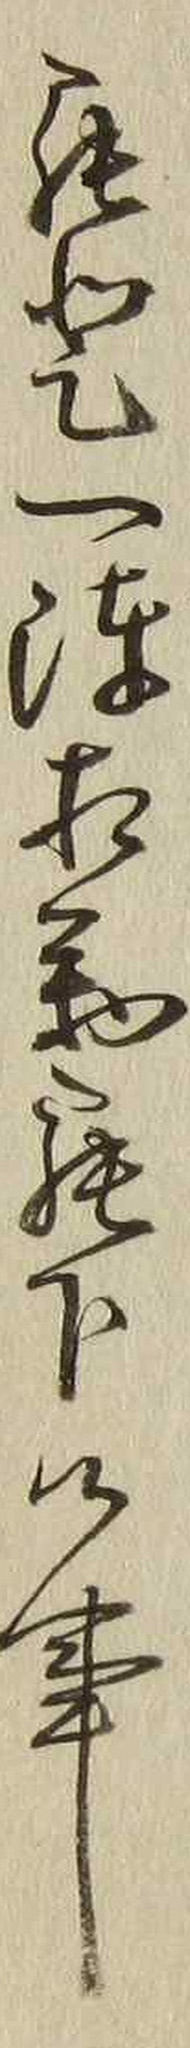罷登一陣相勤罷下候事
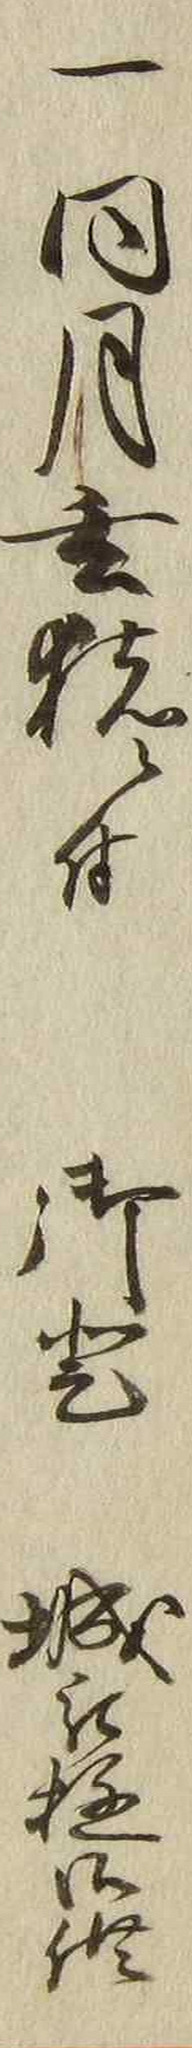一同月玄猪ニ付御登城被遊御供
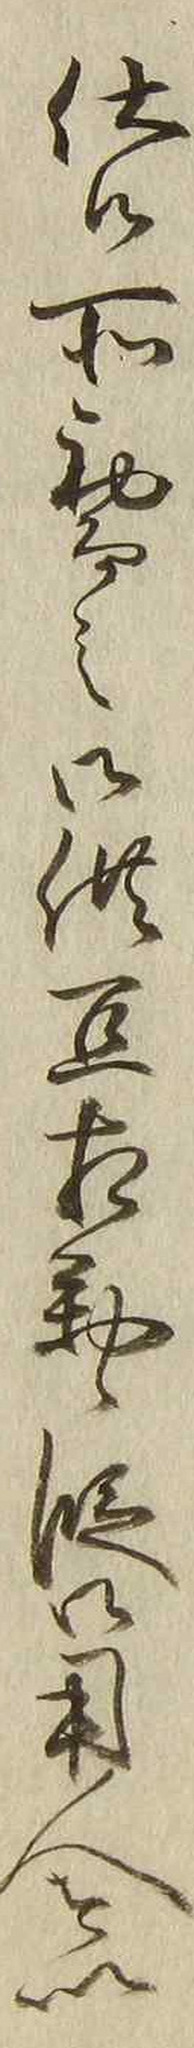仕候所初而之御供宜相勤候段御用人を以
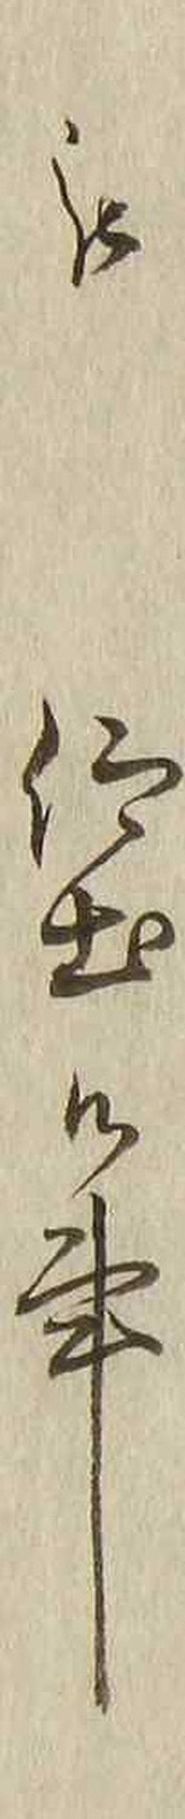被仰出候事
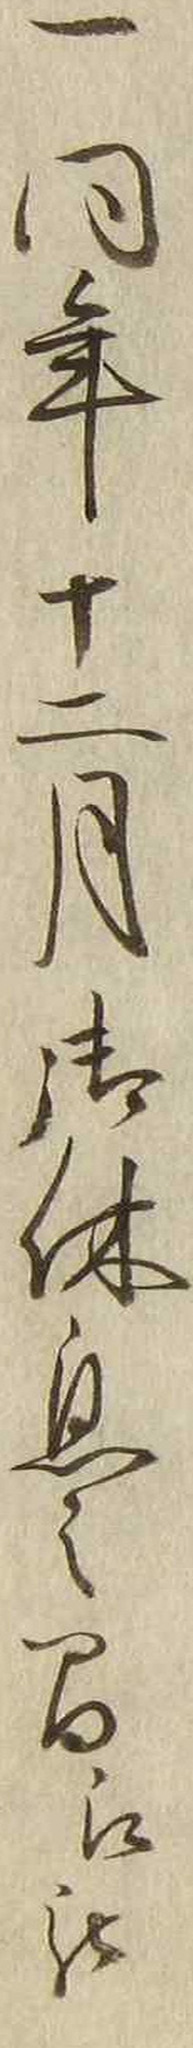一同年十二月御休息之間江被
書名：諸士系譜　巻之60　と之部3
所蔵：会津若松市立会津図書館
